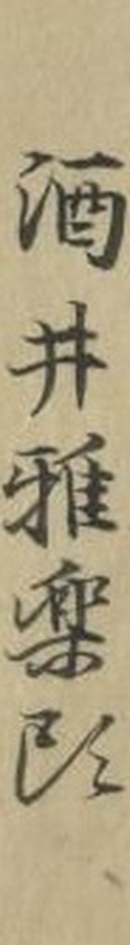酒井雅楽頭
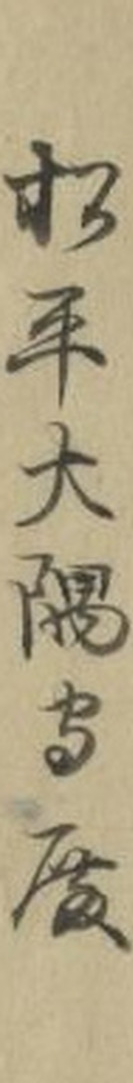松平大隅守殿
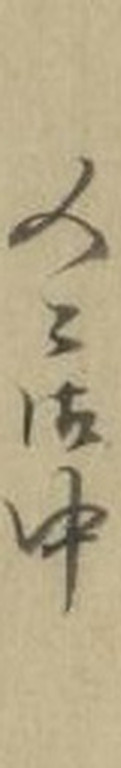人々御中
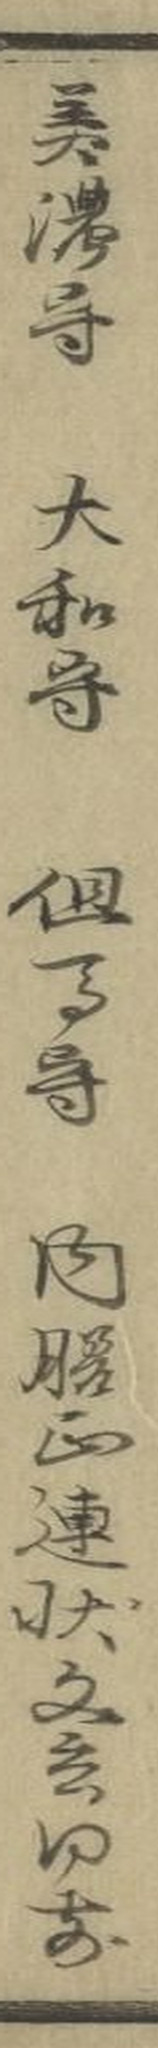美濃守大和守但馬守内膳正連状文言同前
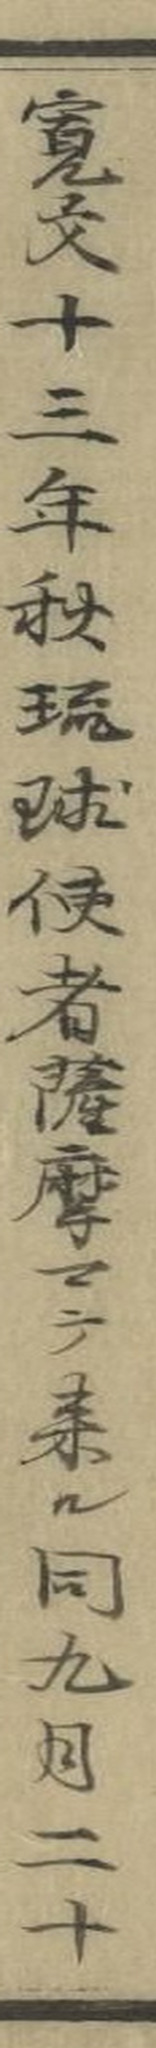寛文十三年秋琉球使者薩摩マテ来ル同九月二十
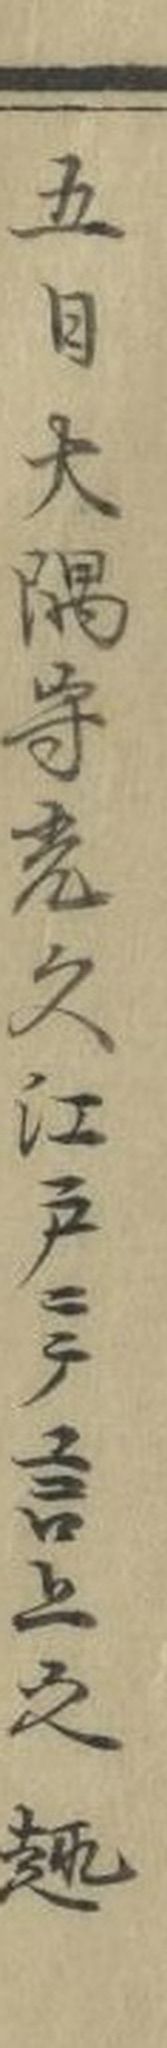五日大隅守光久江戸ニテ言上之趣

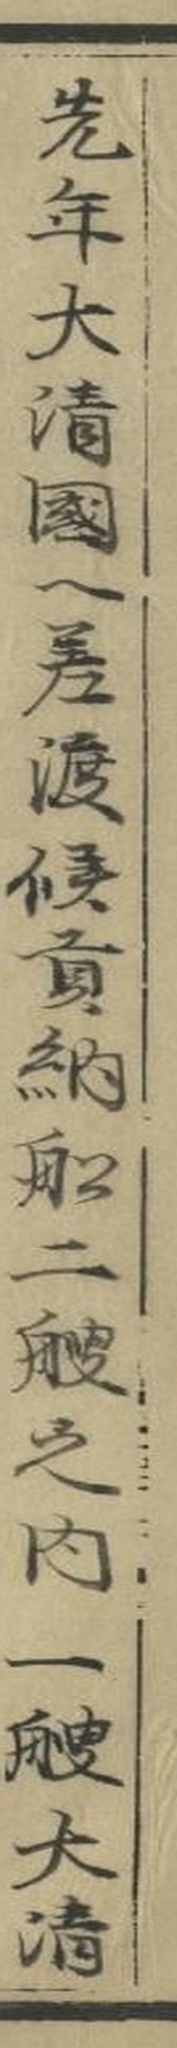先年大清国へ差渡候貢納舩二艘之内一艘大清
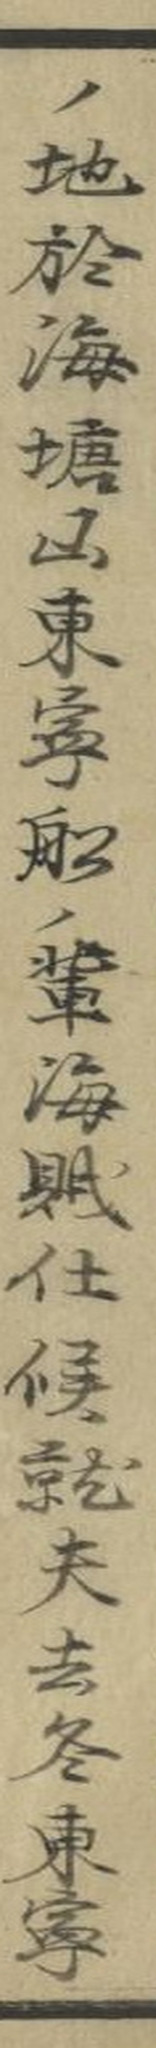ノ地於海塘山東寧舩ノ輩海賊仕候就夫去冬東寧
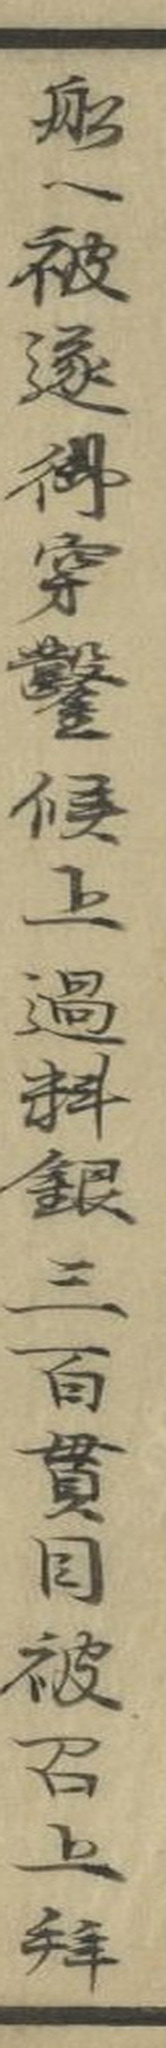舩へ被遂御穿鑿候上過料銀三百貫目被召上拝
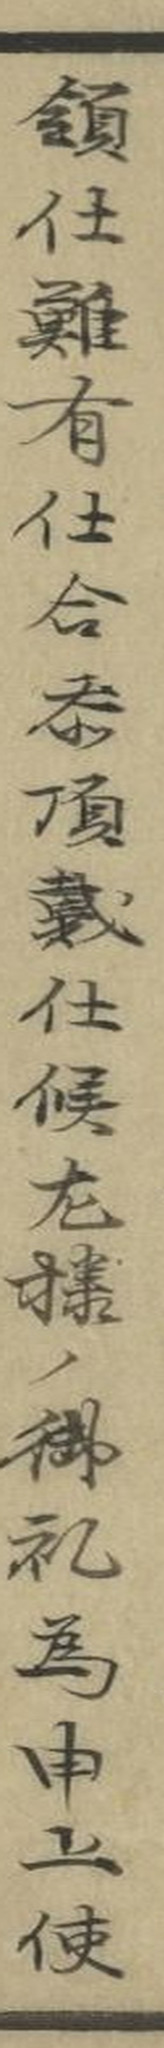領仕難有仕合忝頂戴仕候左様ノ御礼為申上使
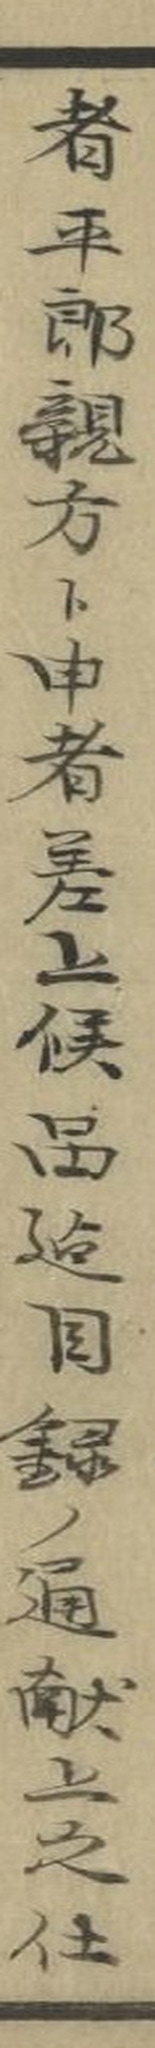者平郎親方ト申者差上候品迄目録ノ通献上之仕
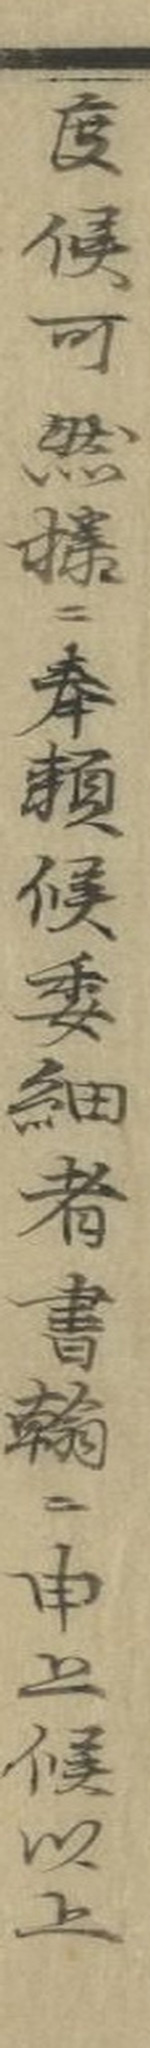度候可然様二奉頼候委細者書翰ニ申上候以上
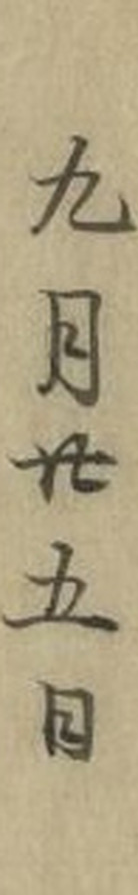九月廿五日
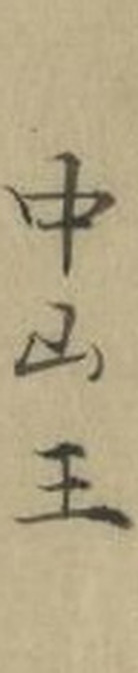中山王

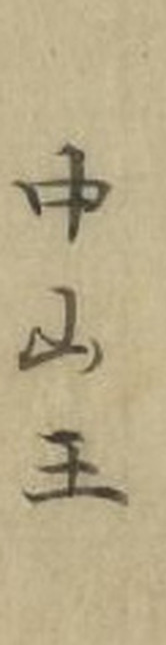中山王
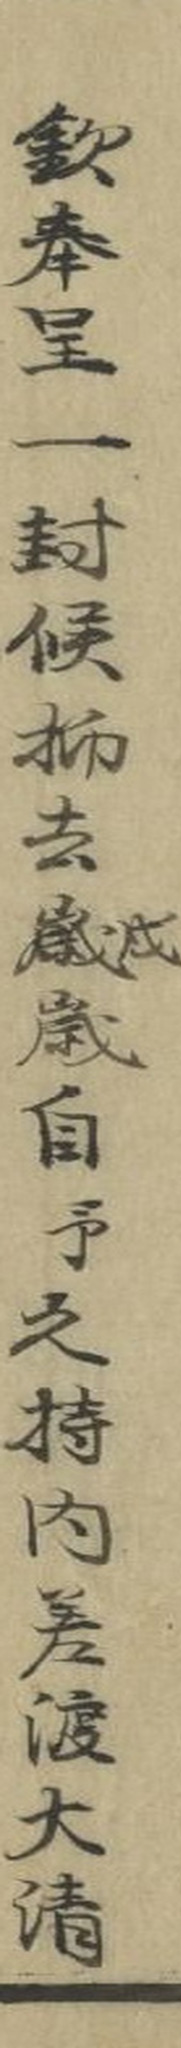欽定奉呈一封候抑去歳自予之持内差渡大清
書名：琉球往来（下）
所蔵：University of the Ryukyus Library
